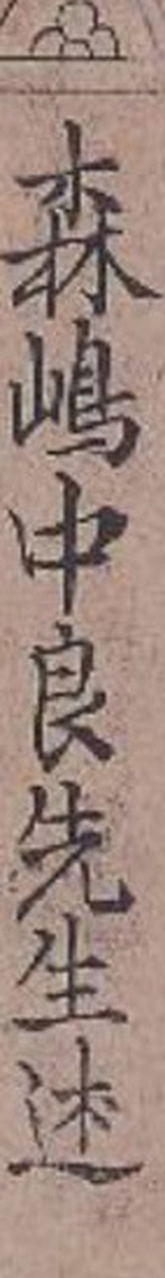森嶋中良先生述
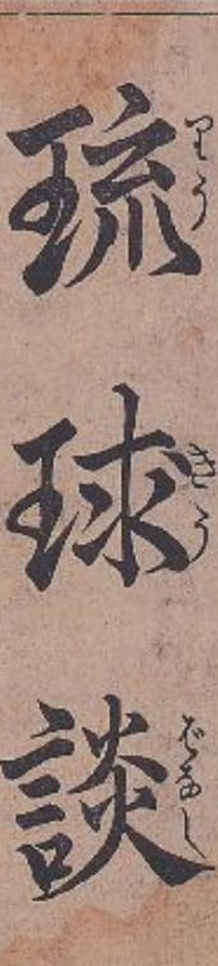琉球談

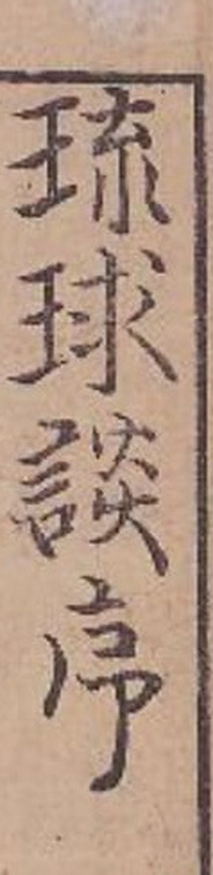琉球談序
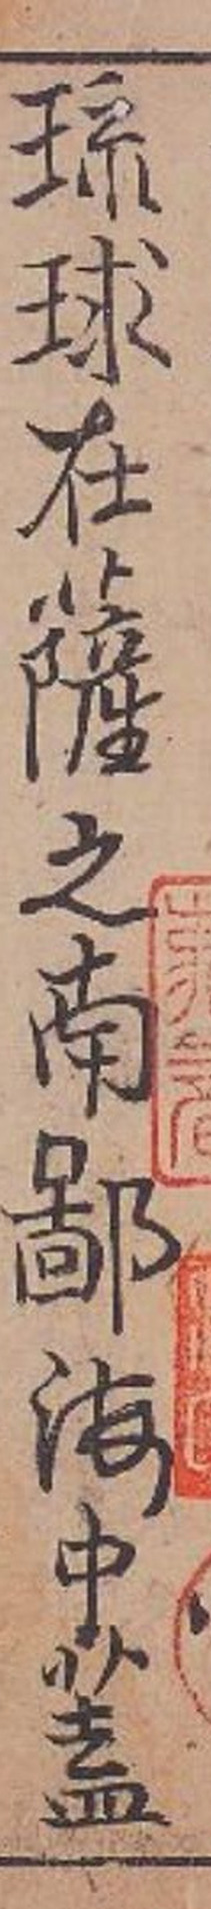琉球在薩之南鄙海中蓋
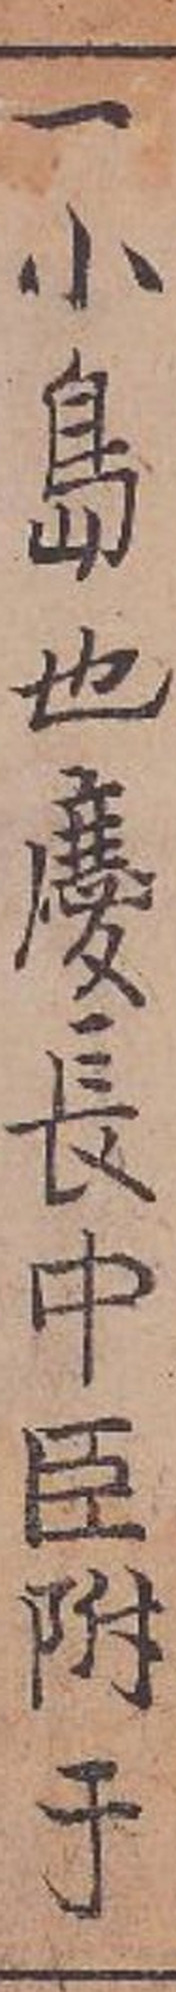一小島也慶長中臣附于
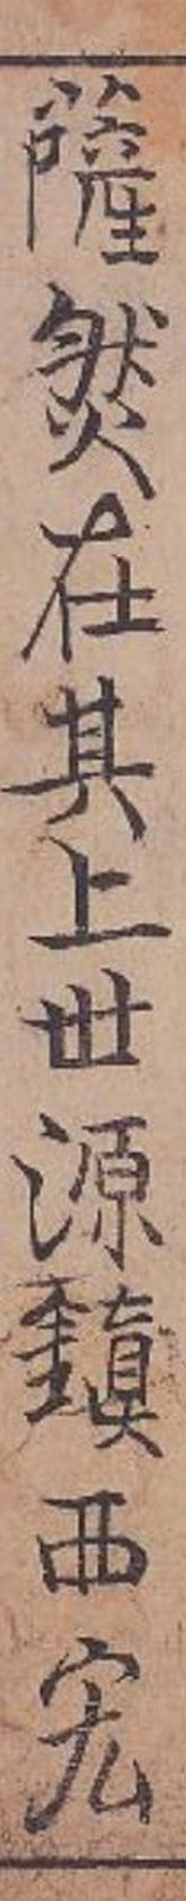薩然在其上世源鎮西宏
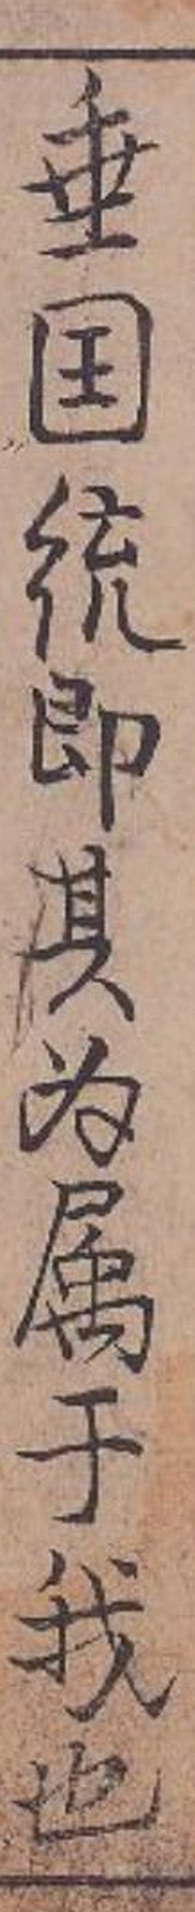垂国統即其為属于我也
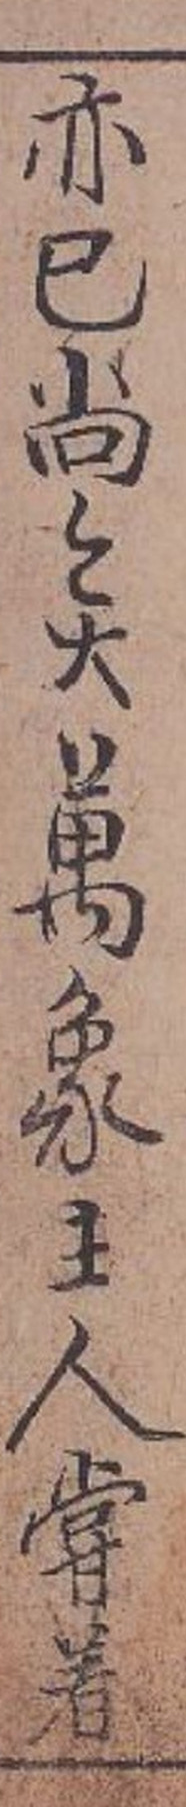亦巳尚矣万象主人甞着

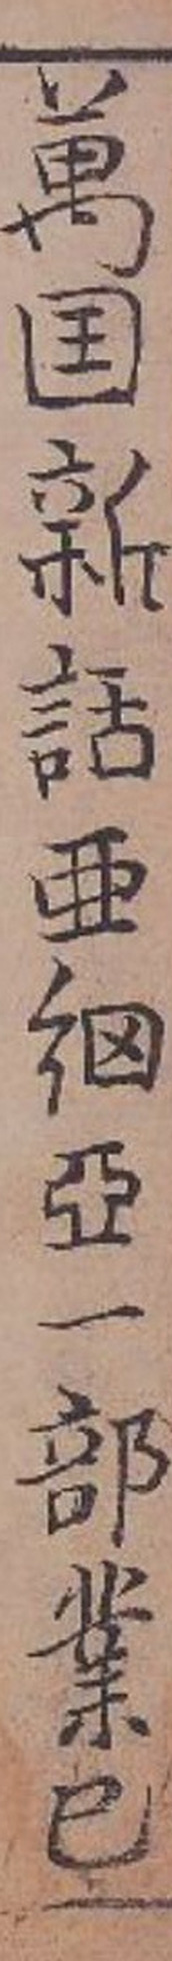万国新話亜細亜一部業巳
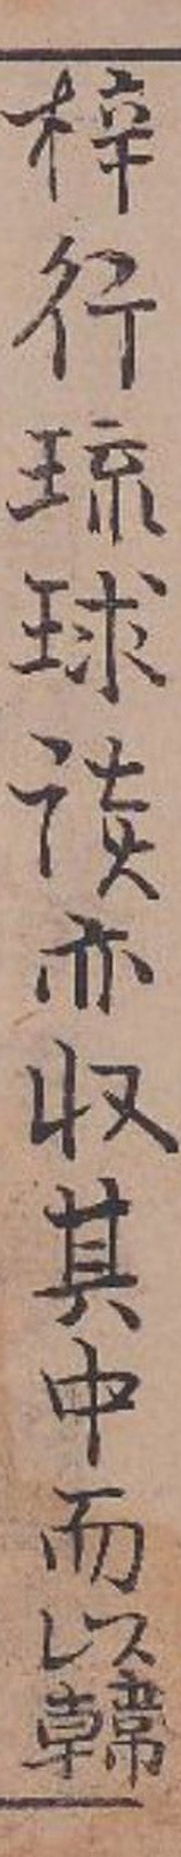梓行琉球談亦収其中而以韓
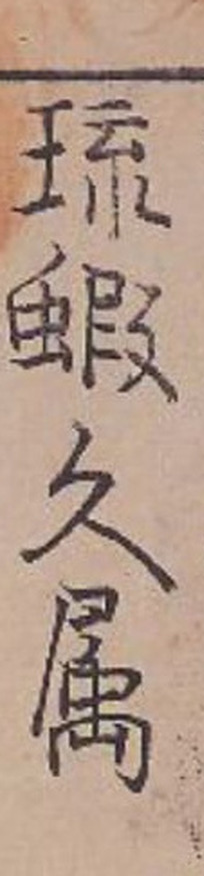琉蝦久属
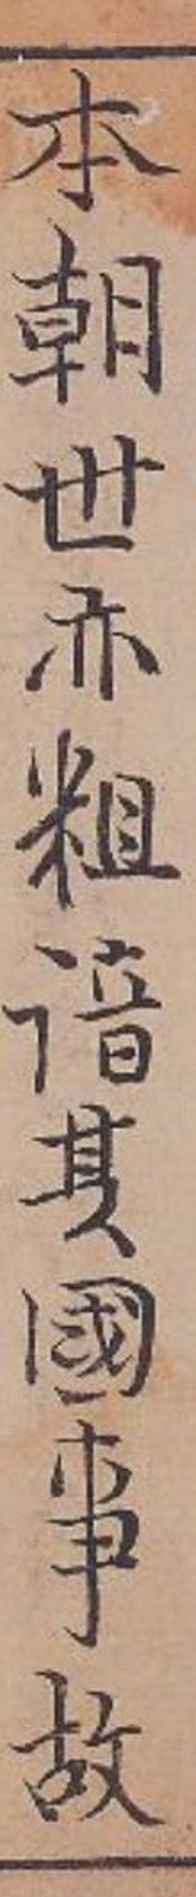本朝世亦粗諳其国事故
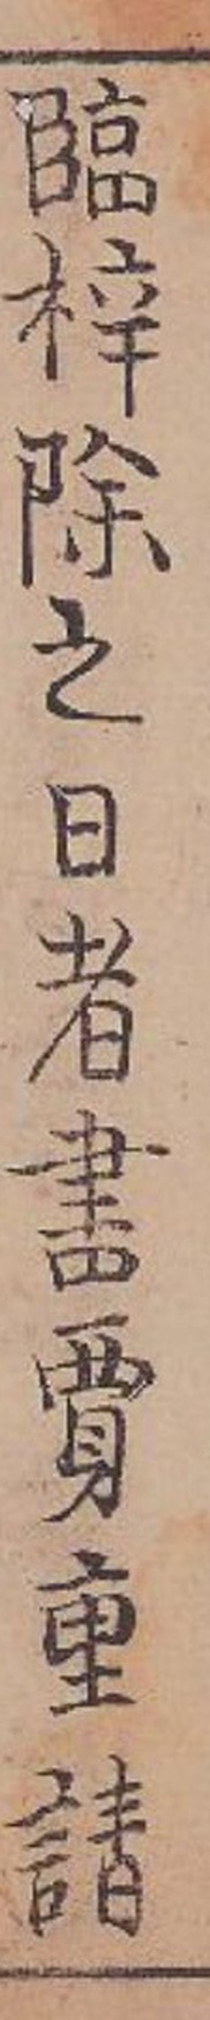臨梓除之日者書賈重請
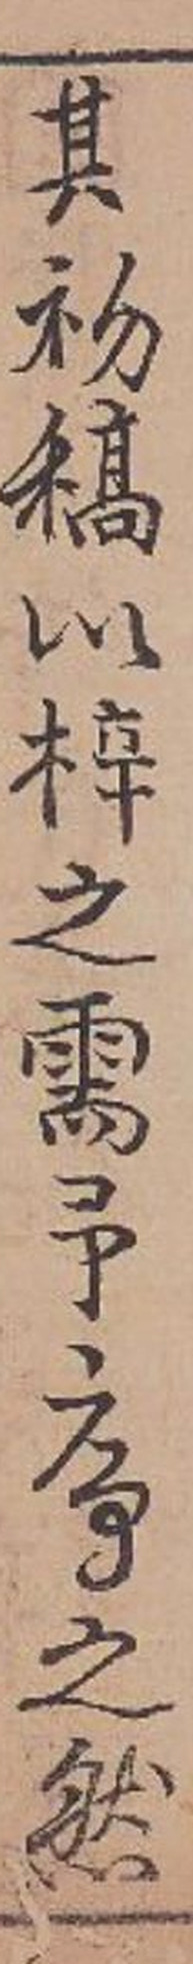其初稿以梓之需予序之然
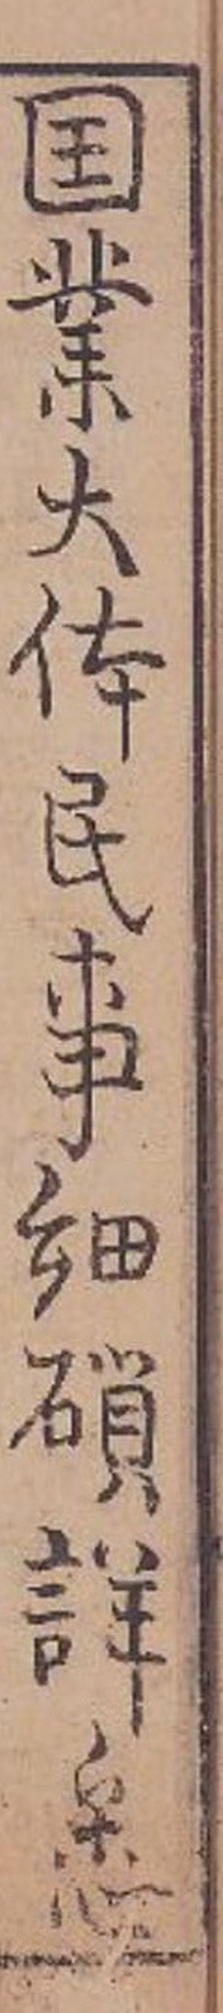国業大体民事細瑣詳悉
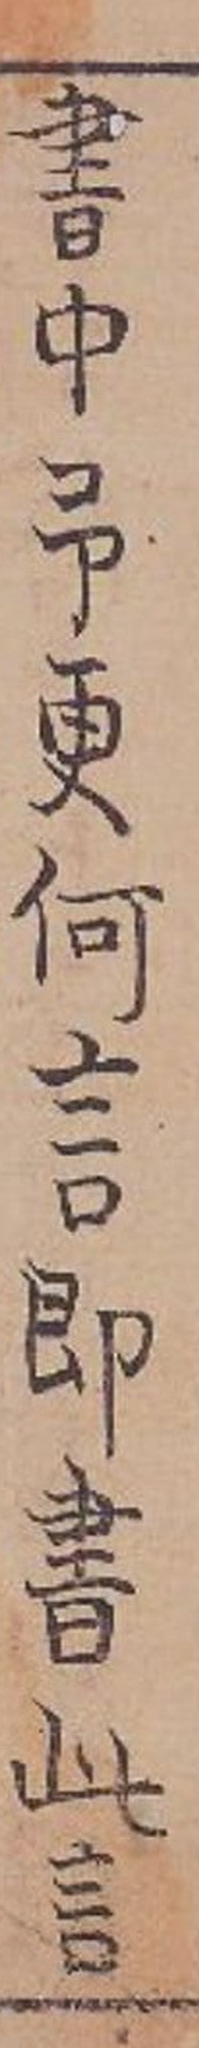書中予更何言即書此言
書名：琉球談
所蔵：University of the Ryukyus Library
